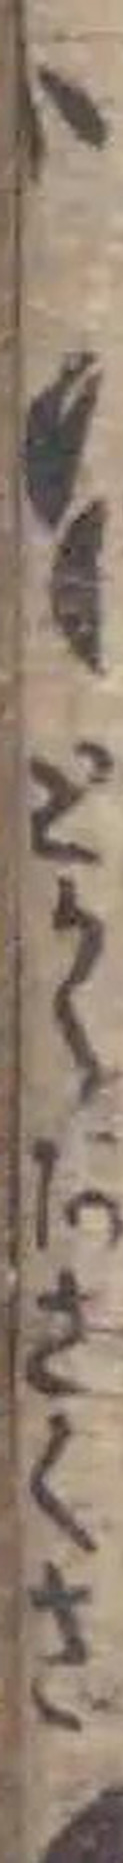とかくあさくさ
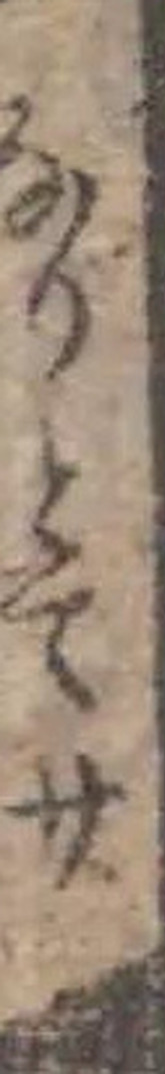なりとて廿
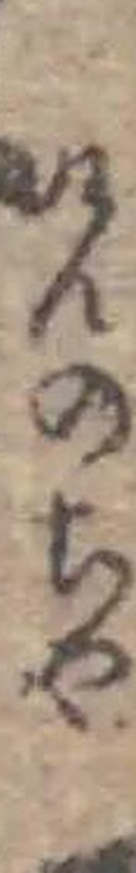けんのちや
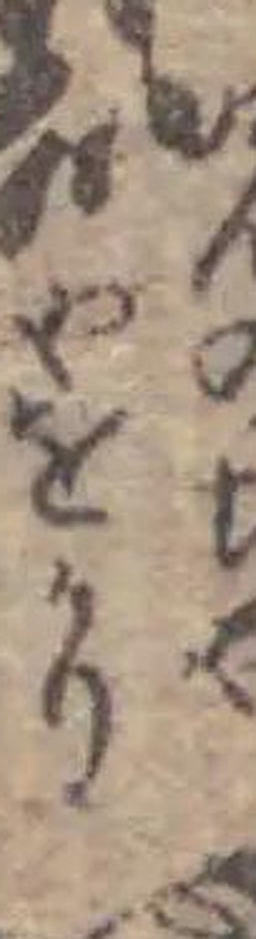やをかり
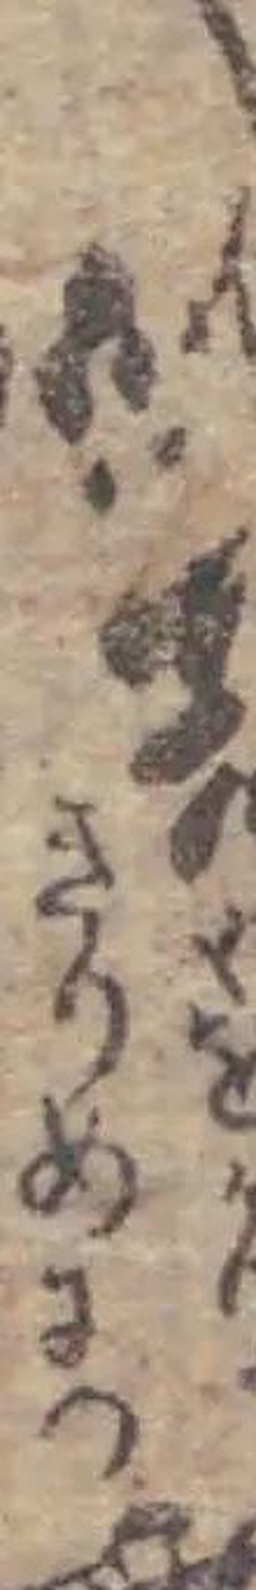きりめにつ
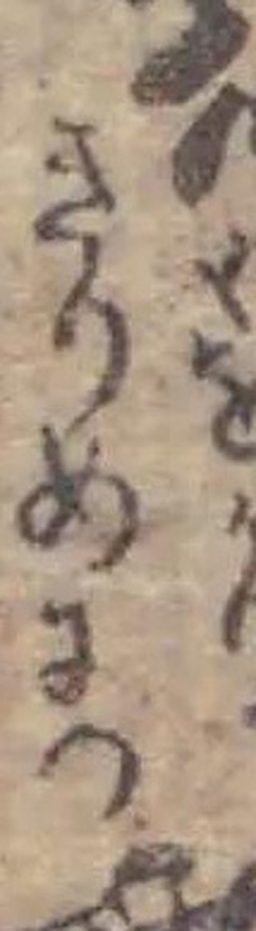きりめにつ
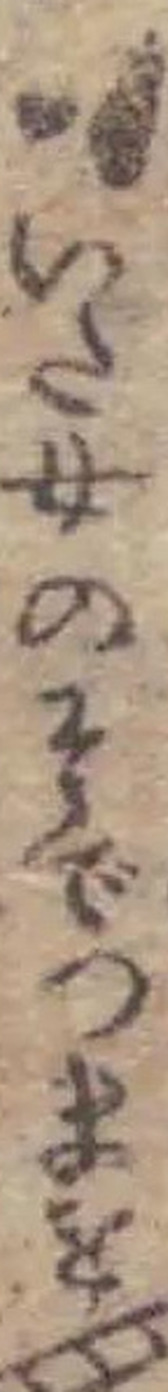いた女のそでつまを
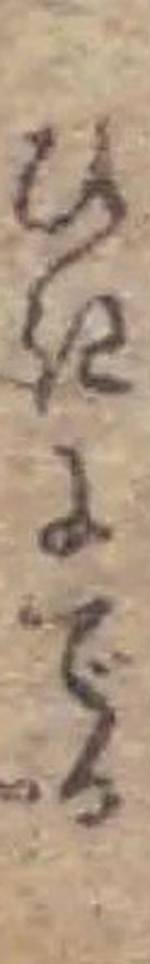ひきにでる
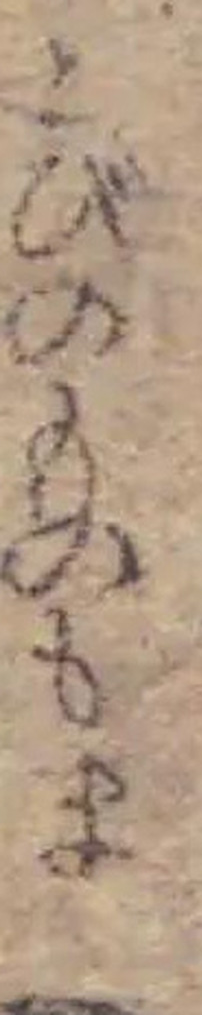とびのものも
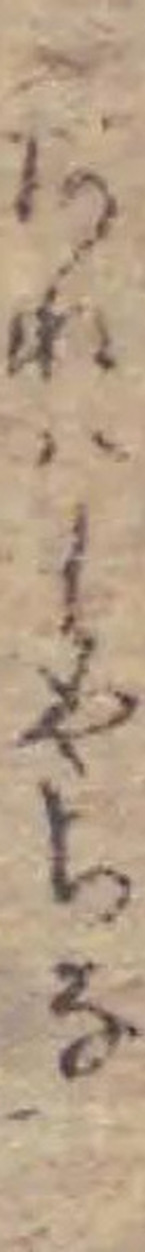あれはしやちな
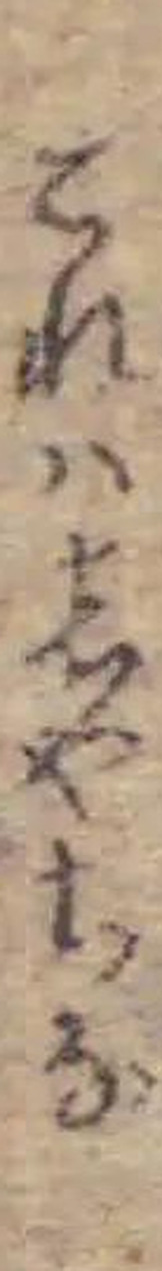これはしやちな
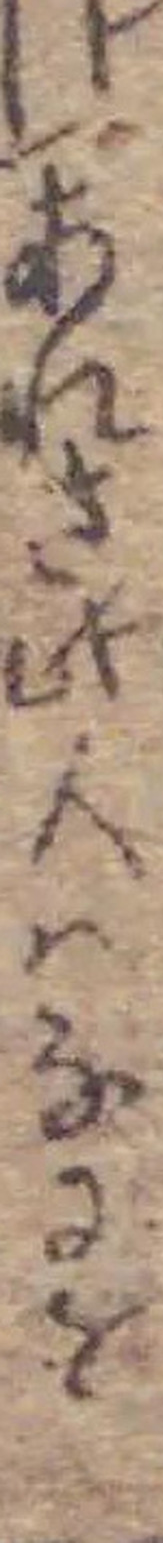あれさ此人はなにを
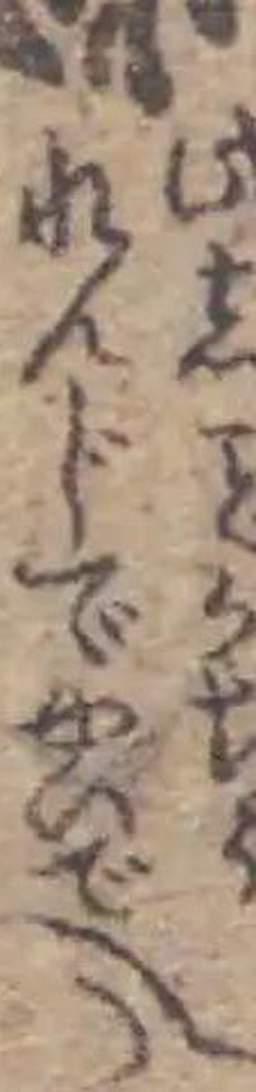れんじでやいで
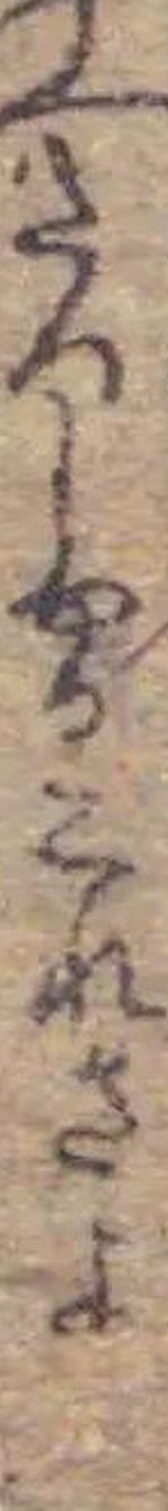さつしやるこれさよ
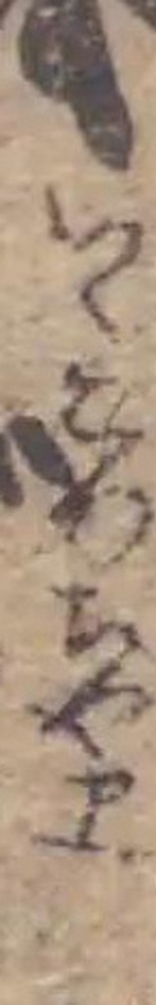いゝこつちやア
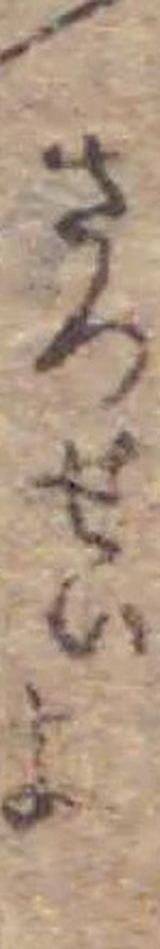さつせいよ
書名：色男其処此処 3巻
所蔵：国立国会図書館 National Diet Library, JAPAN
